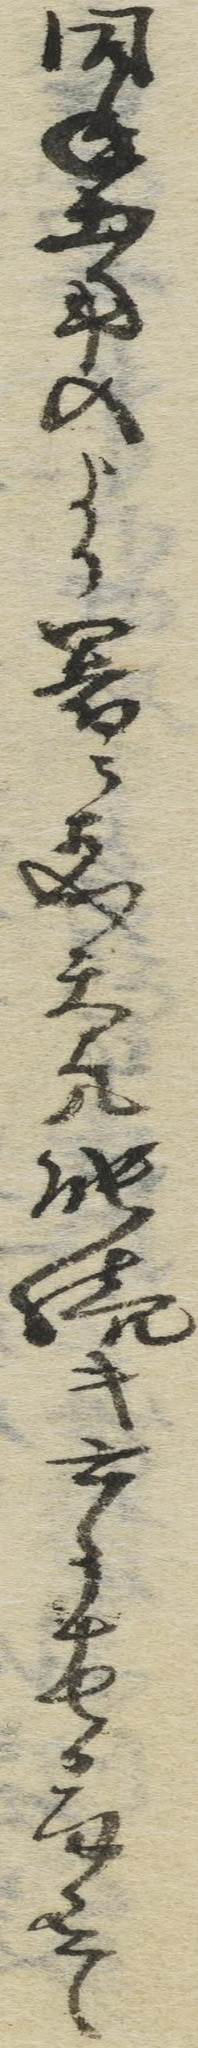同年土用入より暑々相成天気能続キ六月十七日雨有之
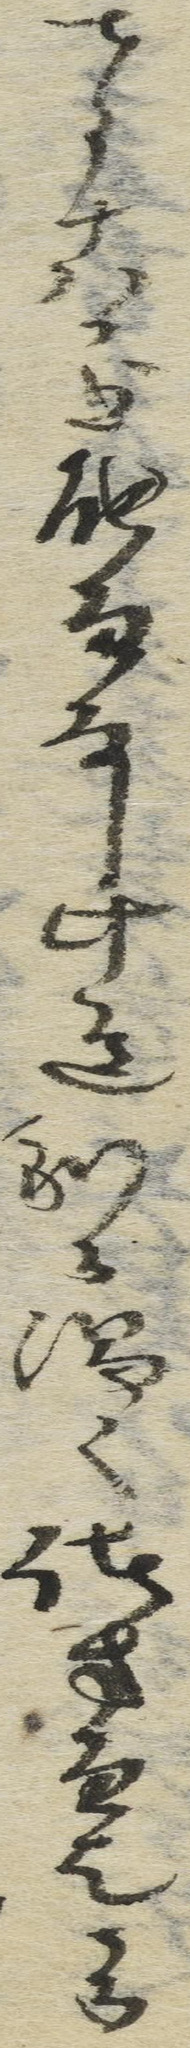七月十八日少能雨なし此辺別而渇く諸方雨乞二而
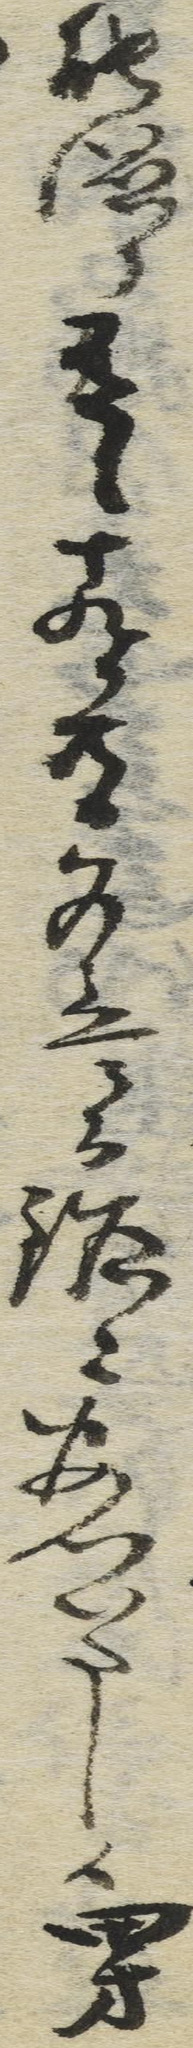能湿り有之十九日廿日夕立二而銘々安心いたし候田方
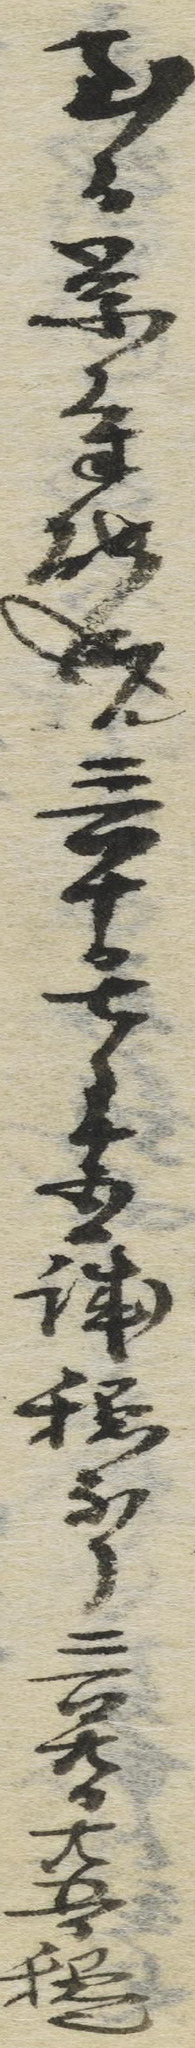至而景気能成ㇽ二百十日七月十五日誠穏なり二百廿日廿五日穏也
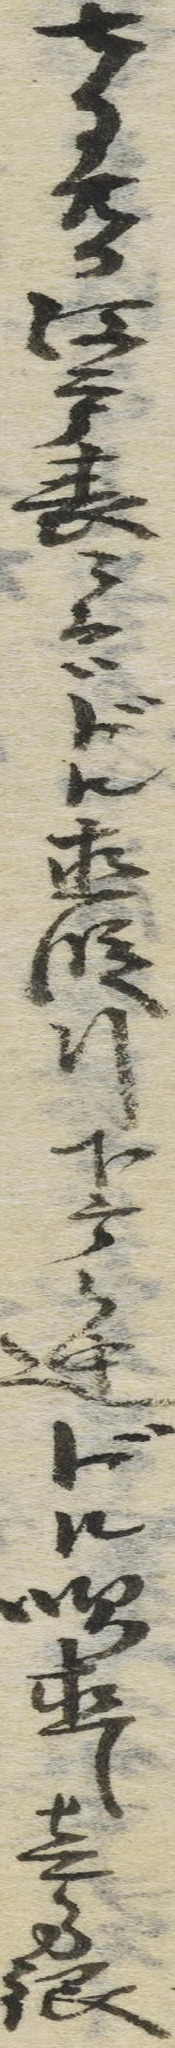○七月廿日江戸表二而ドル直段引下ヶ候迚ドル吹直し壱分銀
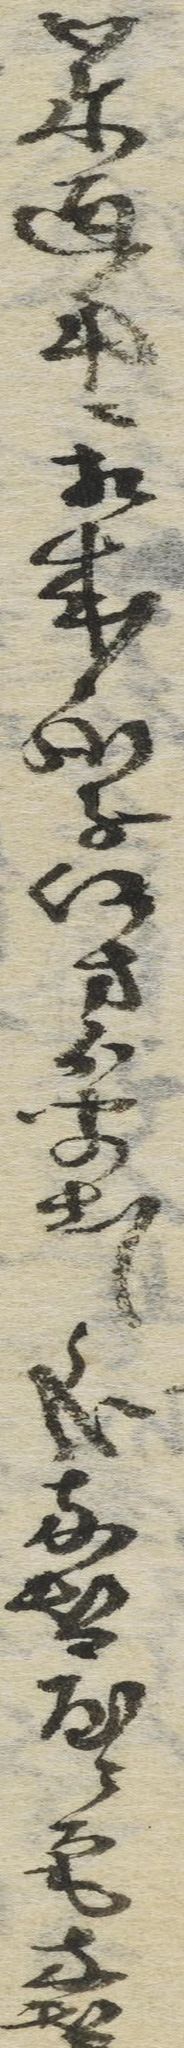弐朱通用二相成様子何方ゟ聞出し候哉両替屋二而も両替
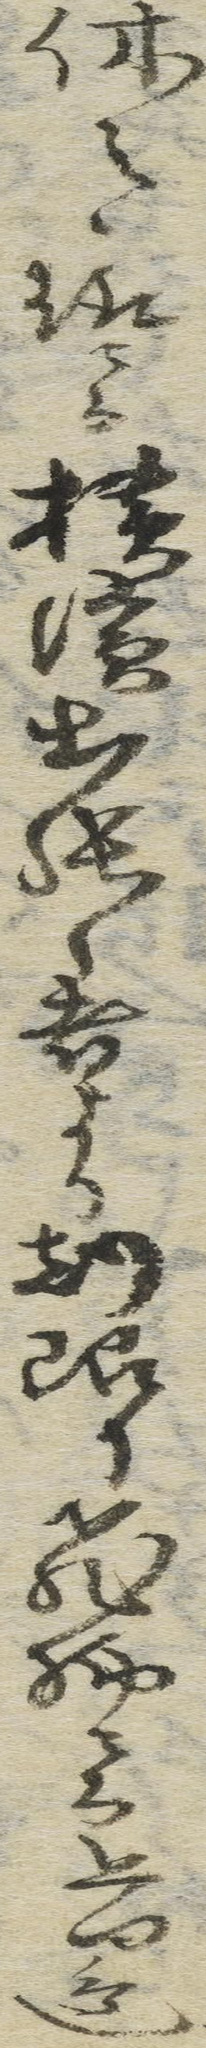休之候趣二而横浜出張之者より刻限り飛脚二而上田辺
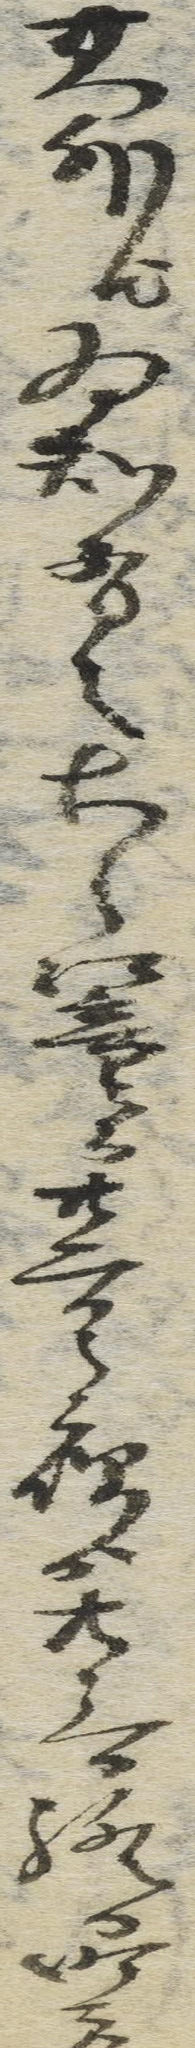其外江為知有之右之響二而廿二日夜ゟ廿三日終日町方
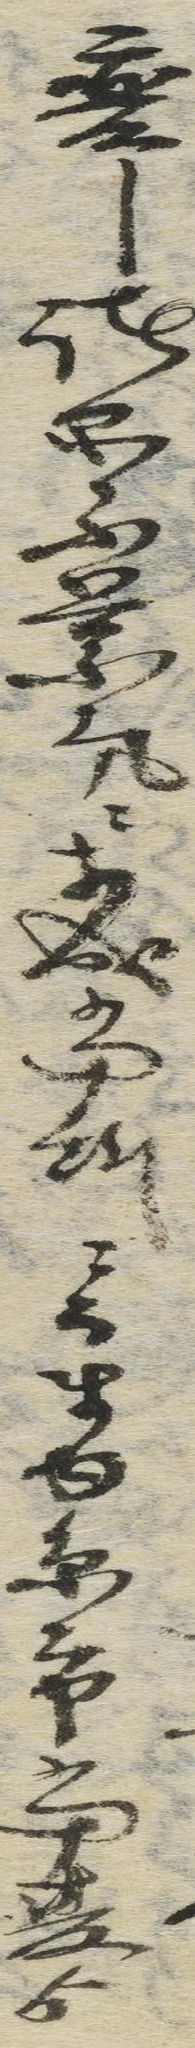変し諸品不景気二相成当所二而まゆ糸市当夏ゟ
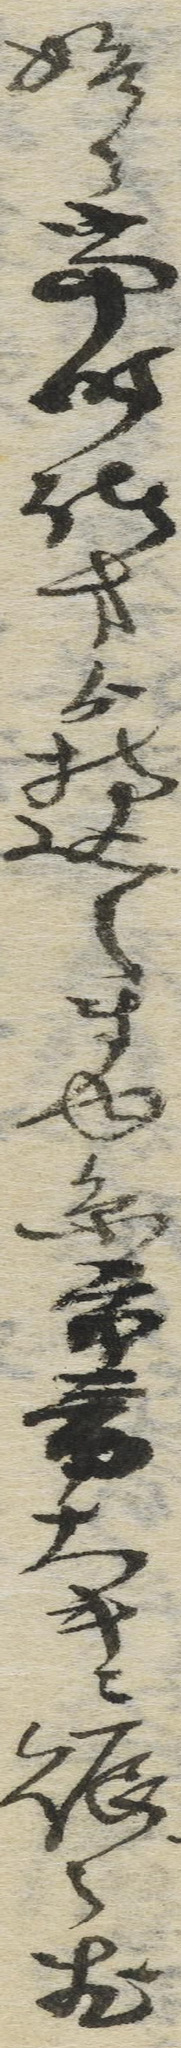始り当時諸方ゟ持込之まゆ糸市方大キ二賑候尤
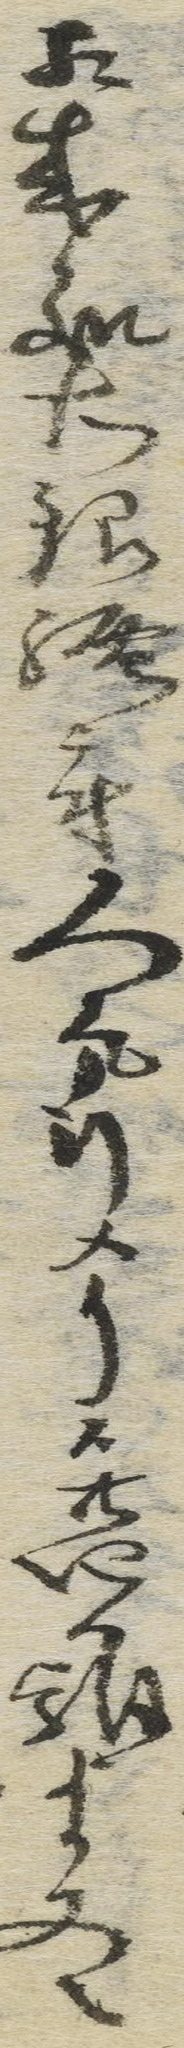相成候処右銀騒二付人気引〆行候廿四日朝より又々
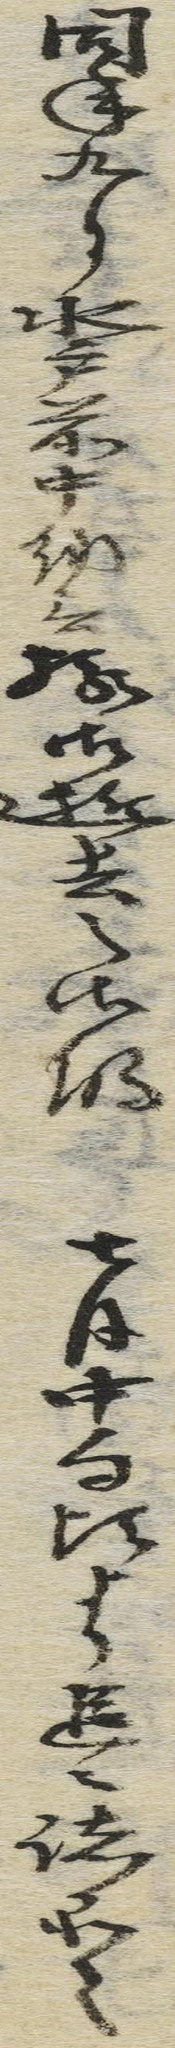○同年九月水戸前中納言様御逝去之御触七月中旬頃より追々諸品々
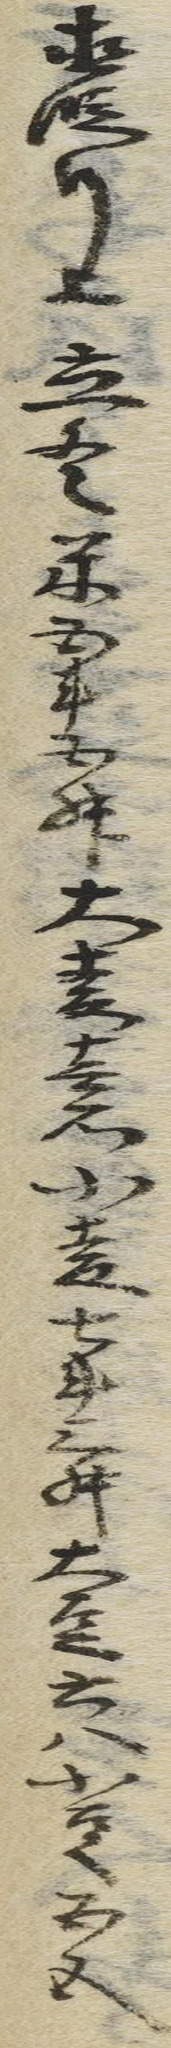直段引上立冬米五斗五升大麦壱石小麦七斗三升大豆六八小豆五五
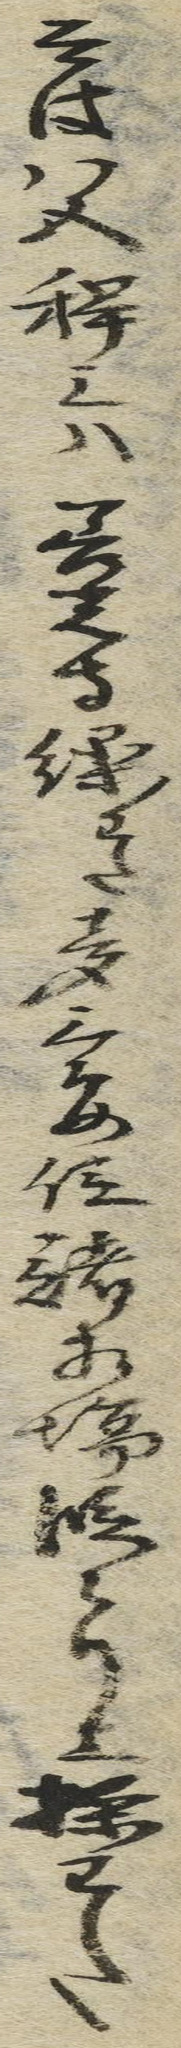そは八五稗三八善光寺繰わた壱貫三百め位諸相場段々引上繰わた
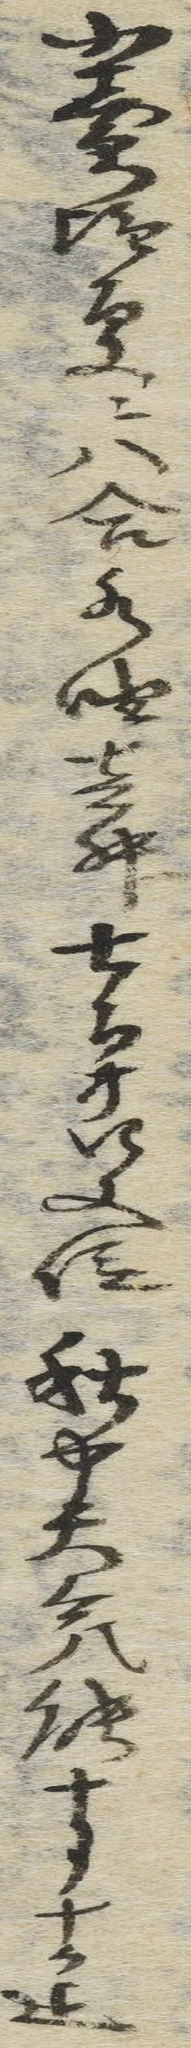小売塩百文二八合水油壱升七百廿四文位秋中天気能十月十日迄
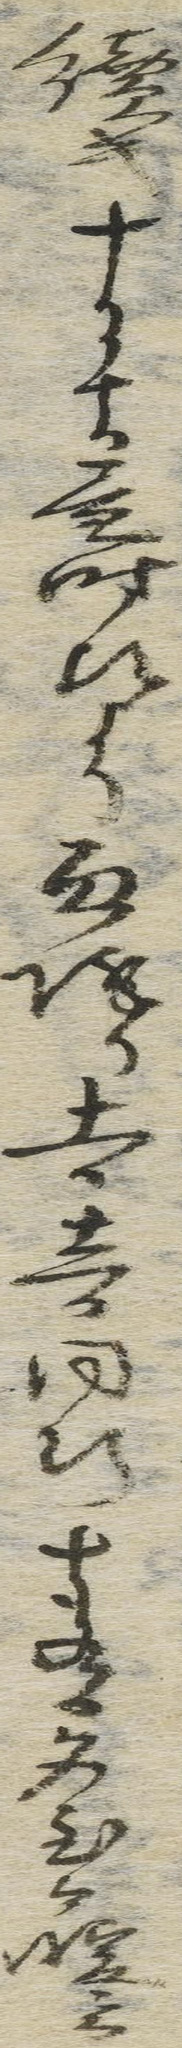続キ十月十日昼時頃より雨降り十一日十二日同断十九日夕至而暖二而
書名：信濃越後　地震書留
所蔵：東京大学地震研究所図書室 Earthquake Research Institute Library, The University of Tokyo, JAPAN
